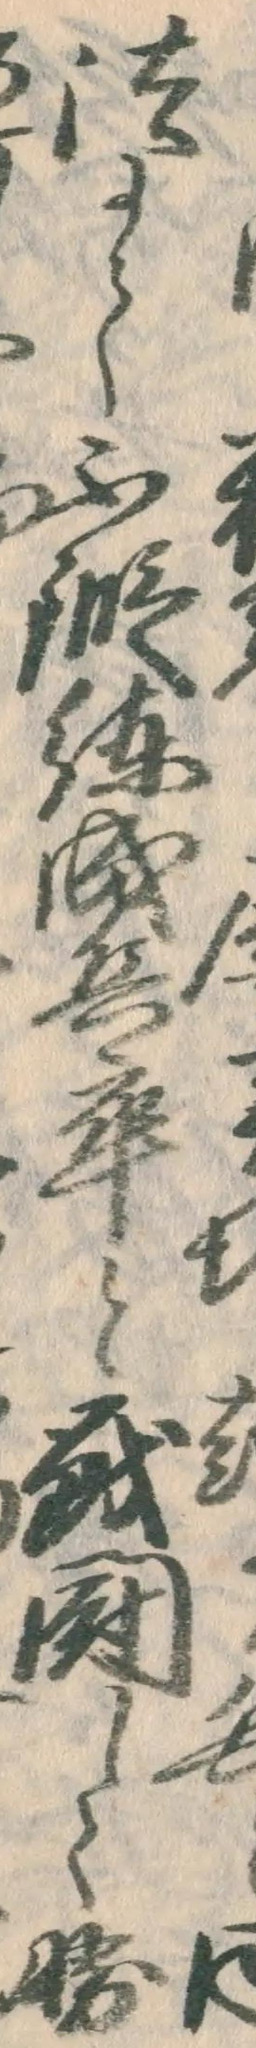法にて不鍛錬成兵卒と戦闘して勝
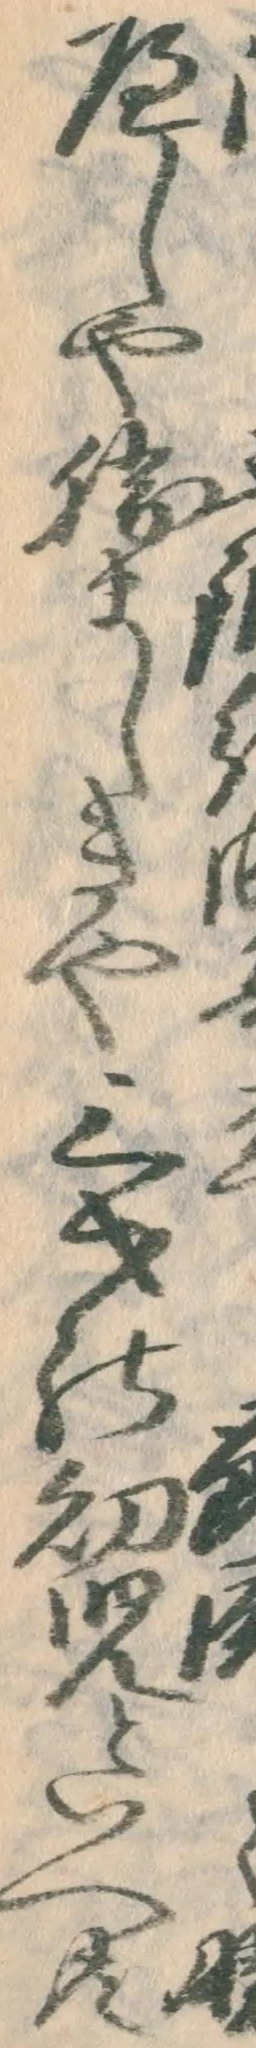へしや勝ましきや三才の幼児といへ共

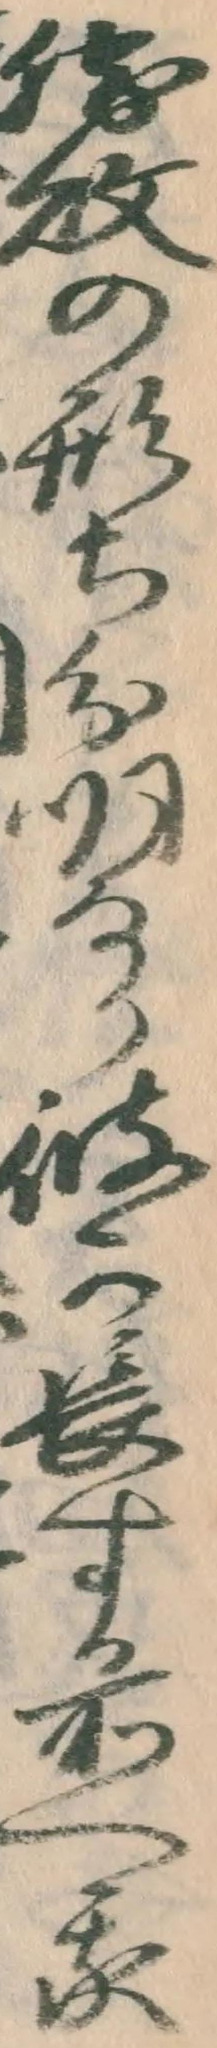勝敗の形ち分明なり彼か長する所へ我
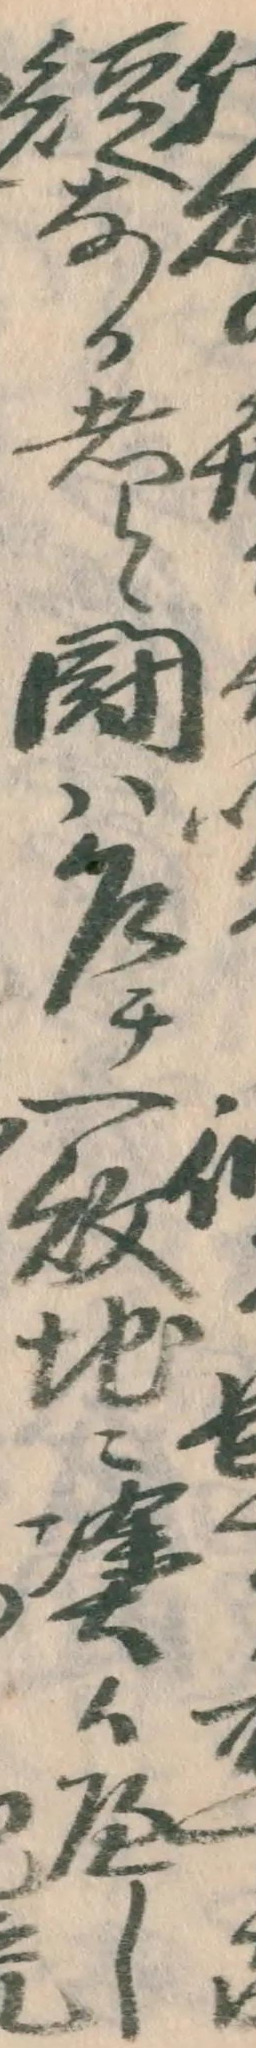短なる者して闘ハ乍チ一敗地ニ塗候へし
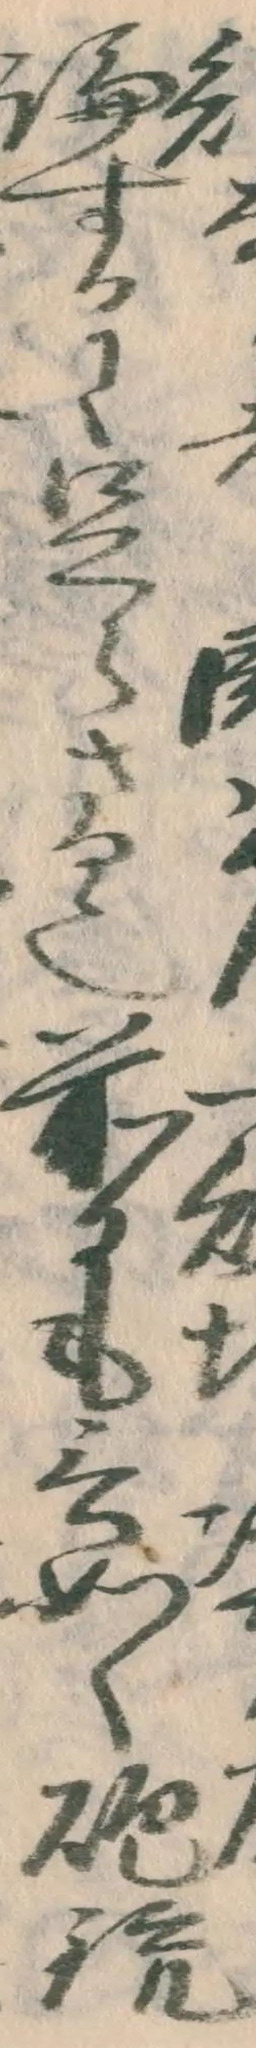論するに足らさる也前にも言如く砲銃
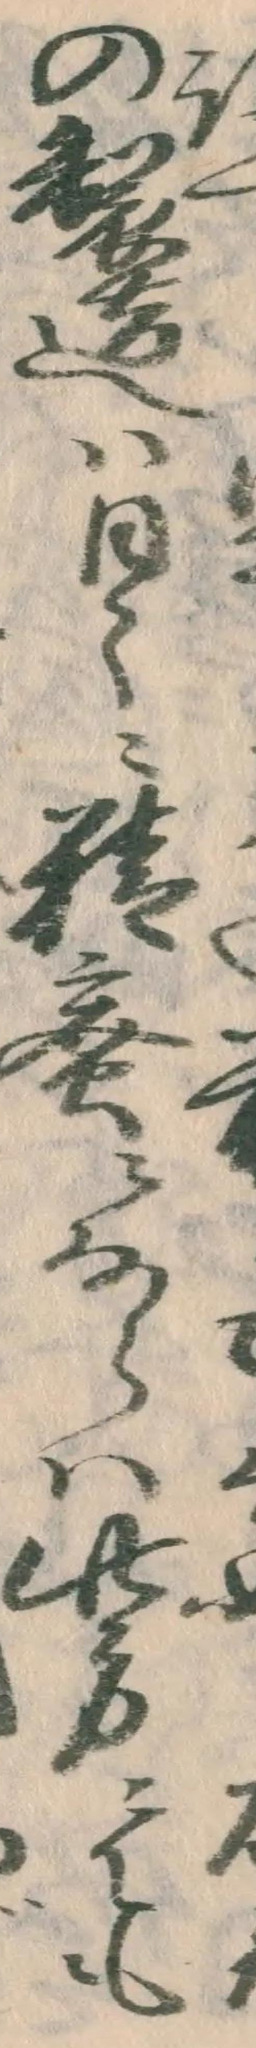の製造ハ日々ニ精密ニならハ此方ニても
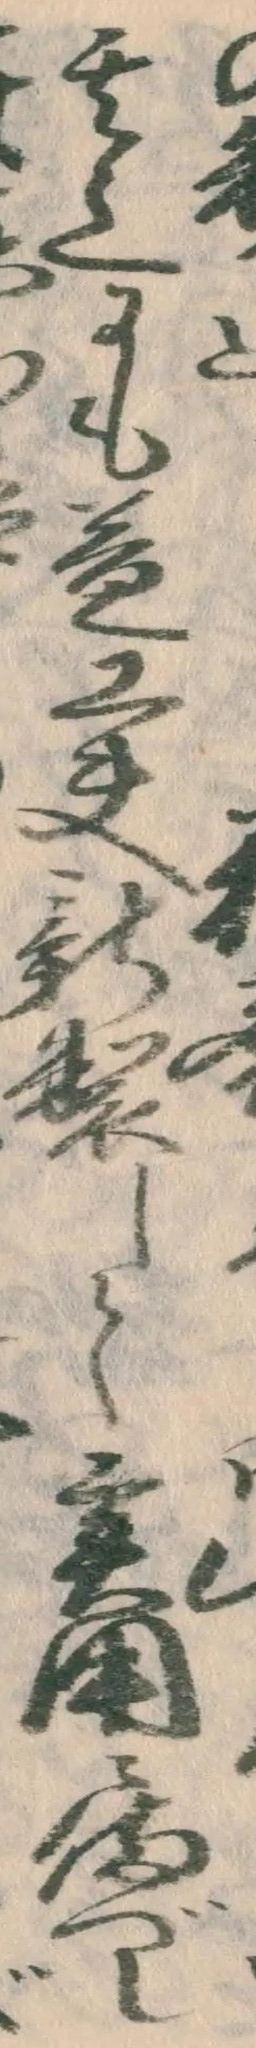其上にも益工夫新製して実用ニ備べし
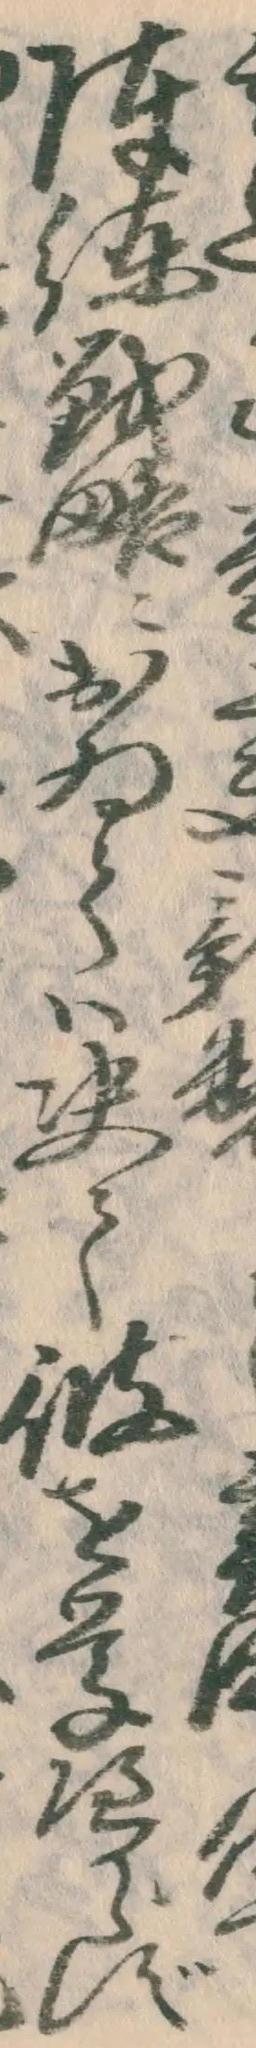陣練戦略ニおゐては決て彼を学へからず
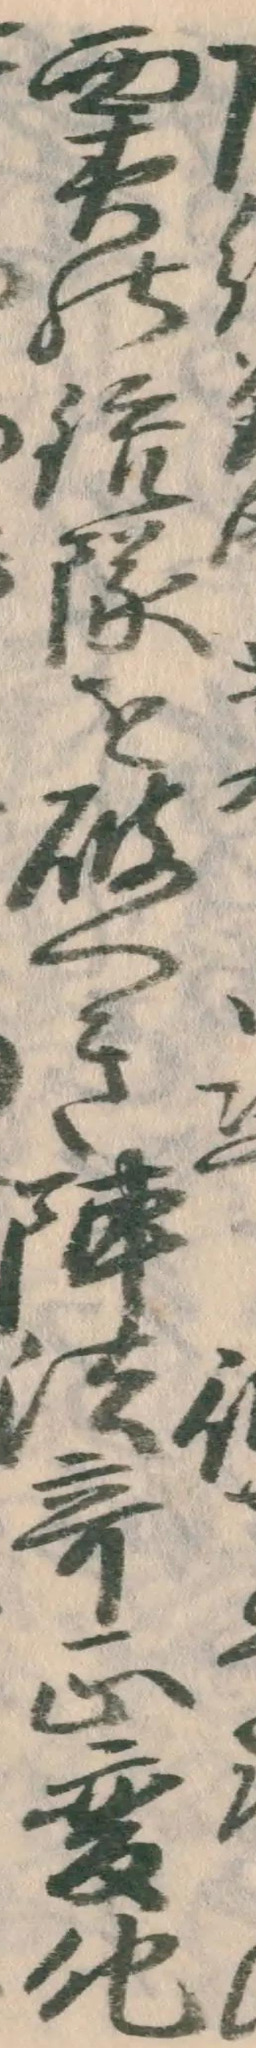西夷の銃隊を破へき陣法奇正変化
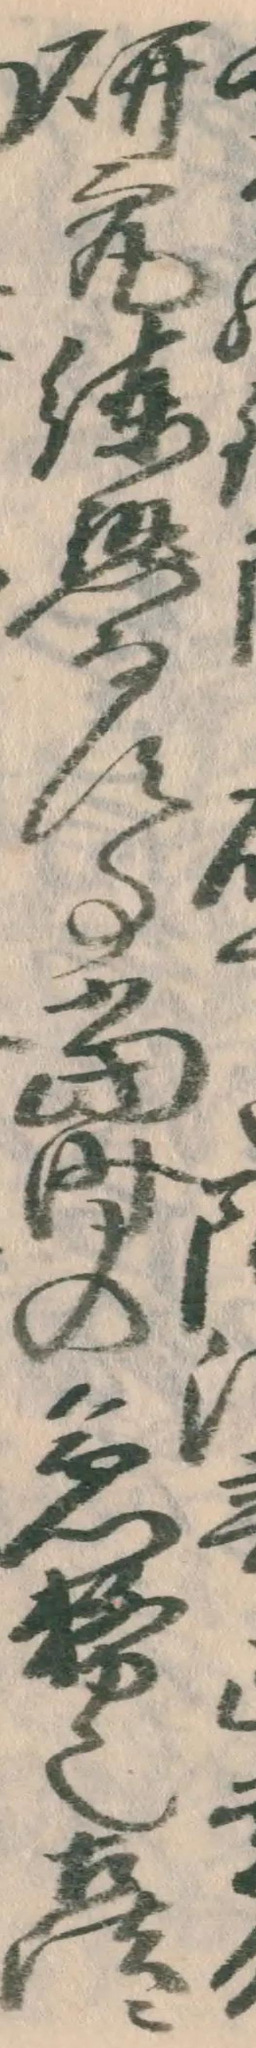研究練熟なす事當時の急務也古法ニ
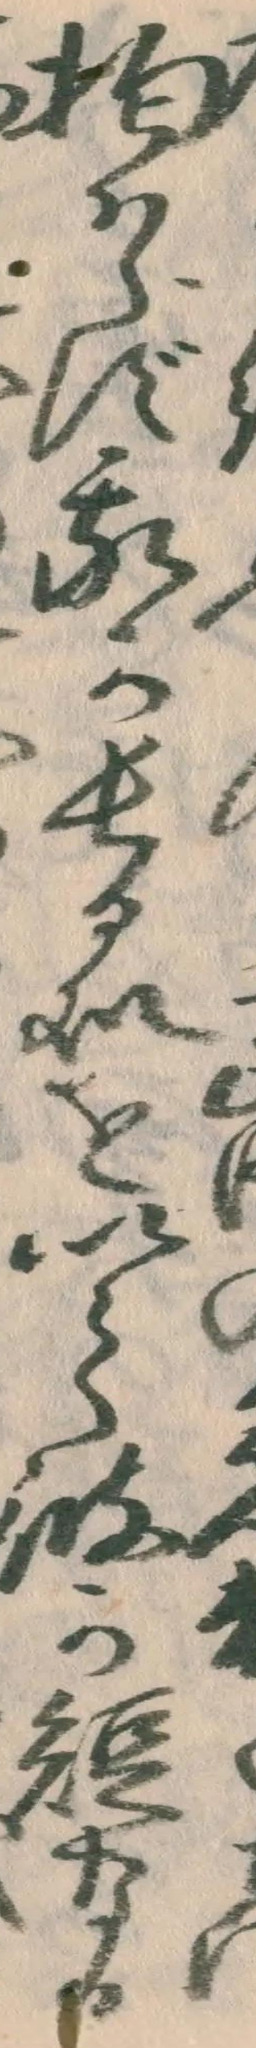拘はらず我か長る処を以て彼か短なる
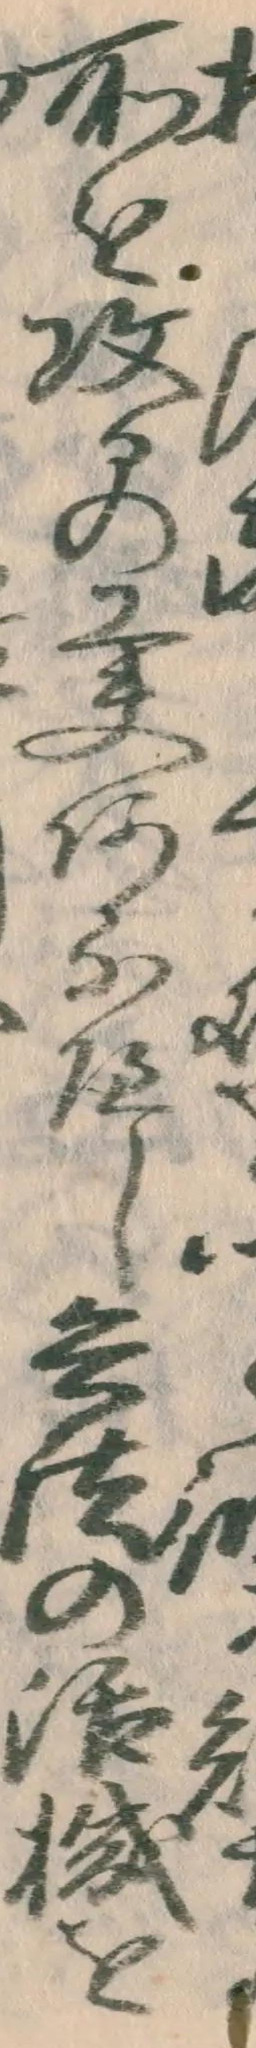所を攻るの工夫あるへし兵法の活機を
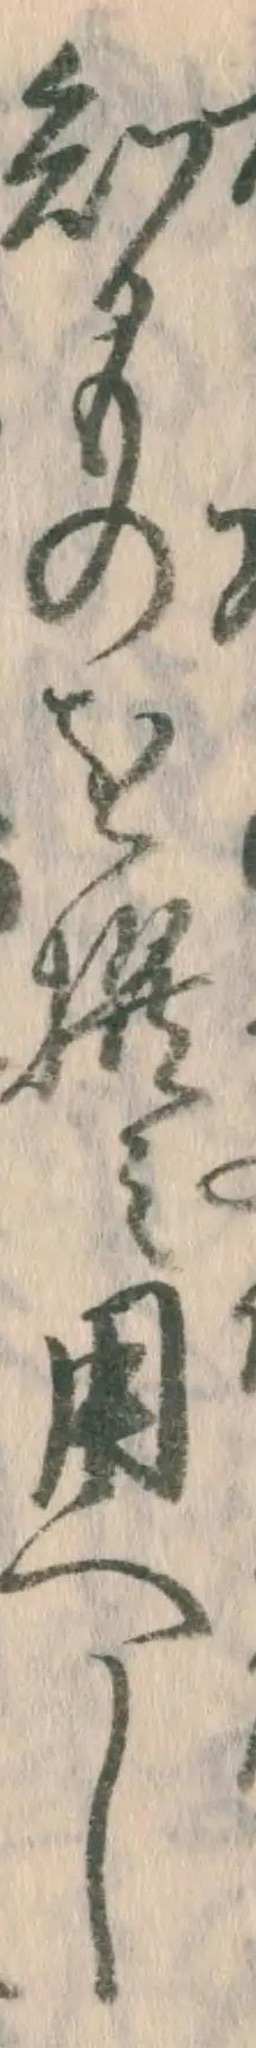知るものを撰ミ用へし
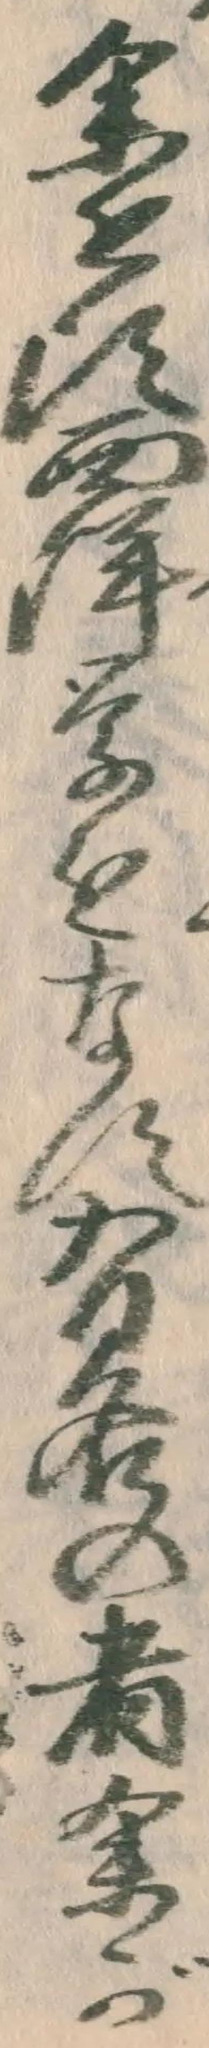余近頃西洋学をなす有名の者余が
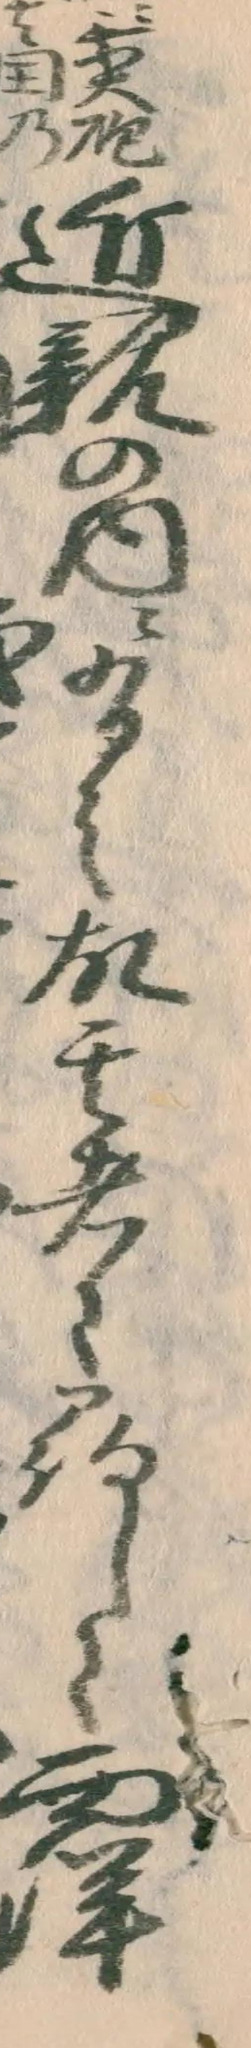近親の内ニ有之故其者に尋して西洋
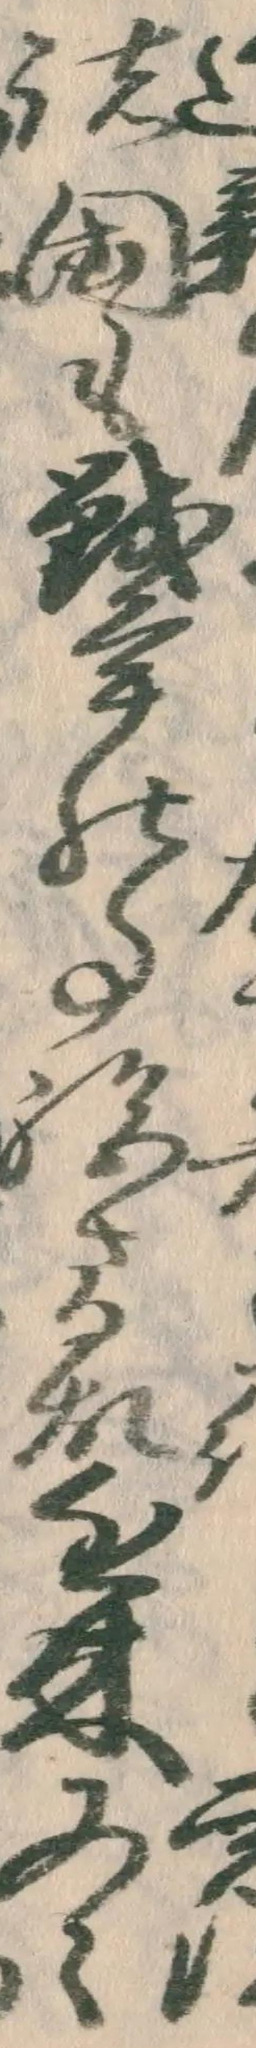諸国も戦争の事絶さる故近来又々
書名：麗斎叢書. 20
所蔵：国立国会図書館 National Diet Library, JAPAN
